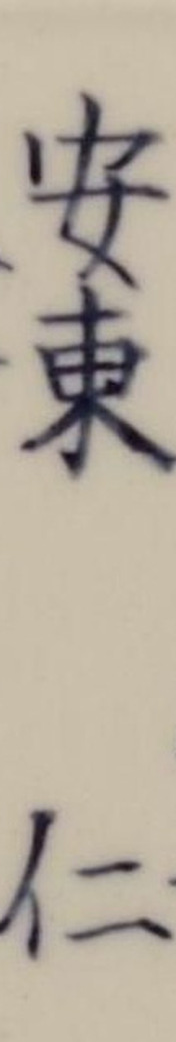安東仁
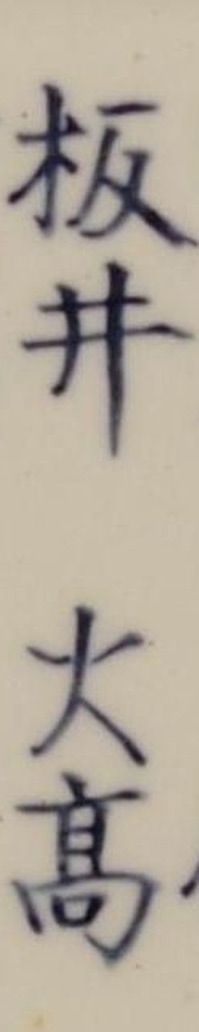板井大高
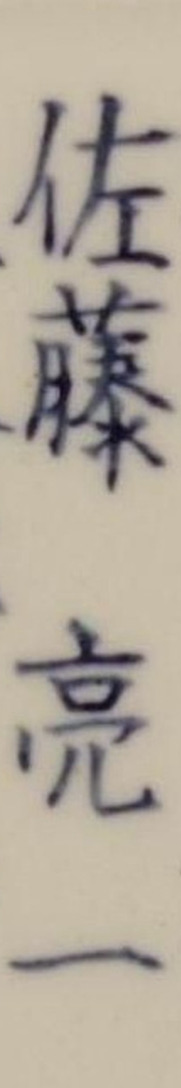佐藤亮一
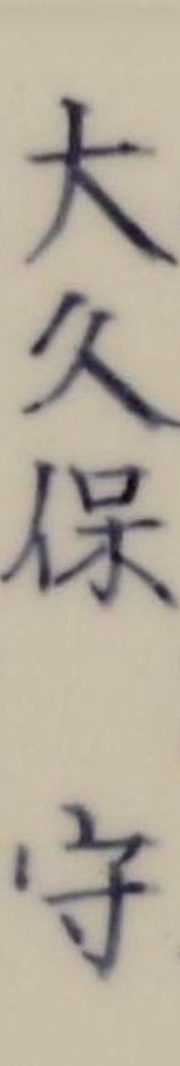大久保守
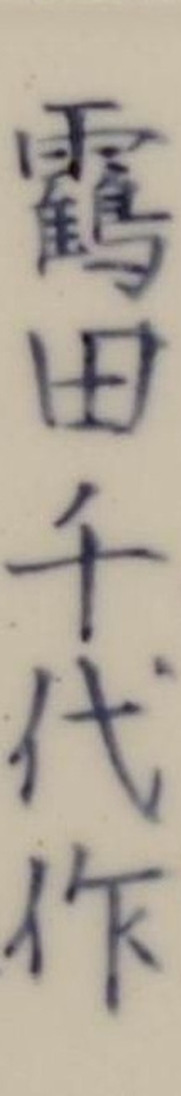鶴田千代作
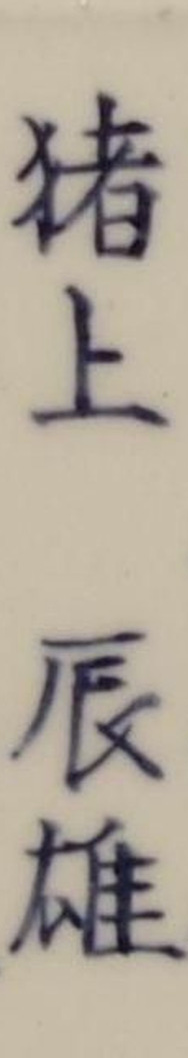猪上辰雄
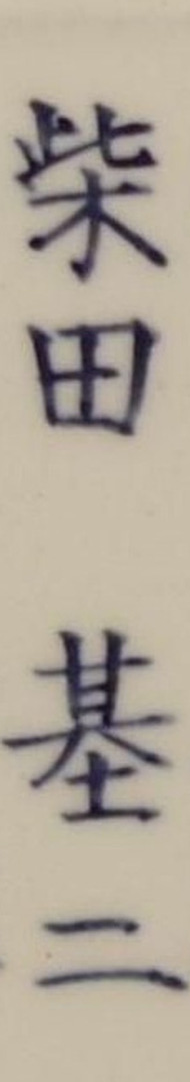柴田基二
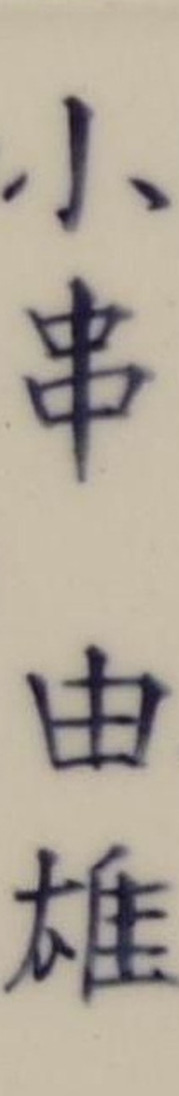小串由雄
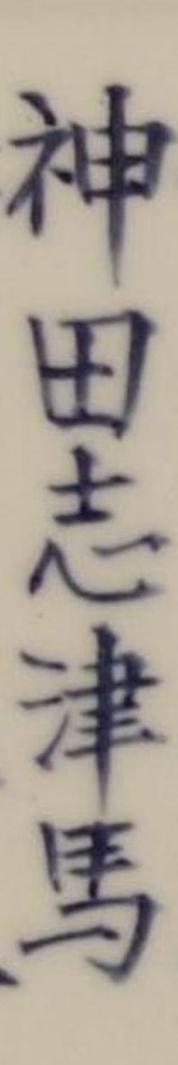神田志津馬
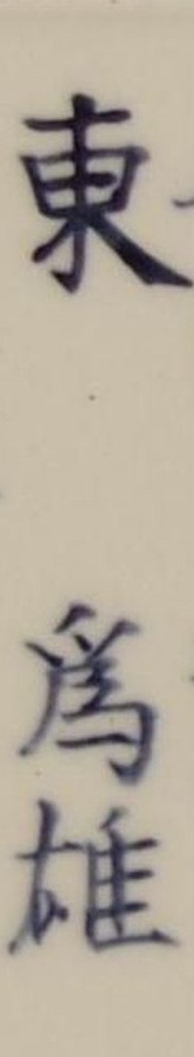東為雄
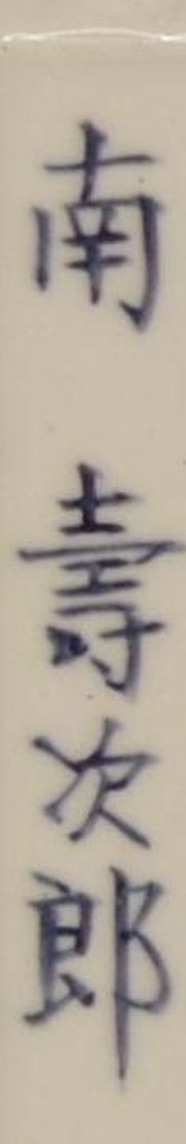南寿次郎

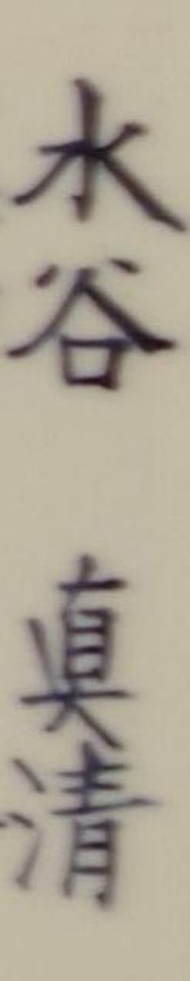水谷真清
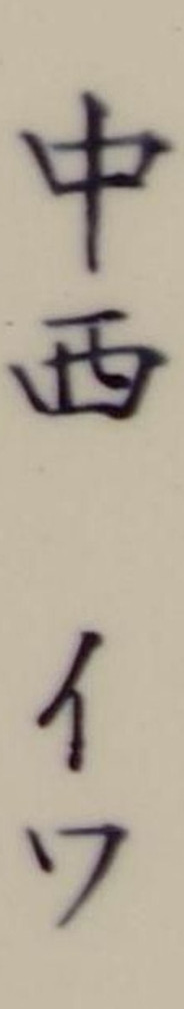中西イワ
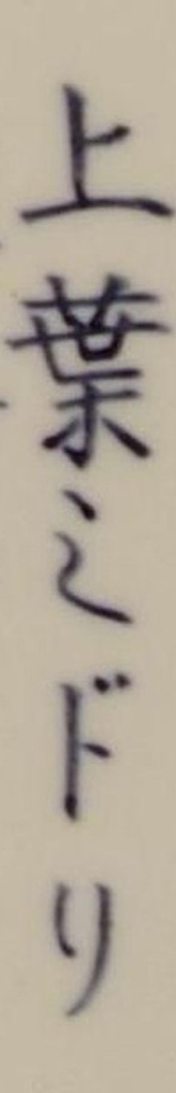上葉ミドリ
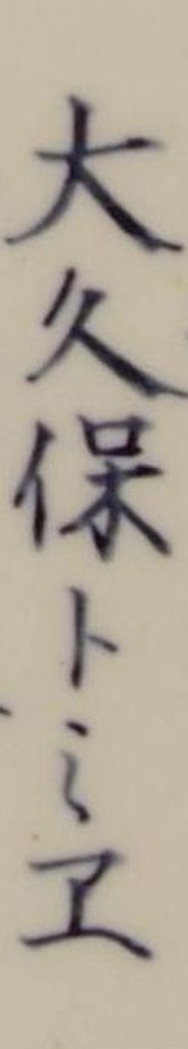大久保トミヱ
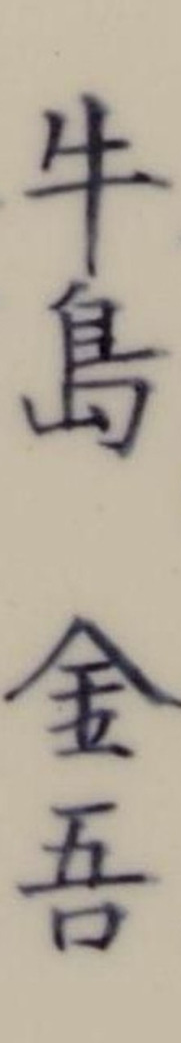牛島金吾
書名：M~S
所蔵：高野山金剛峯寺
